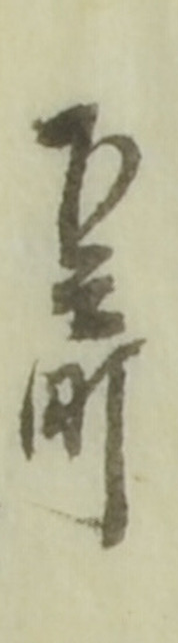下モ町
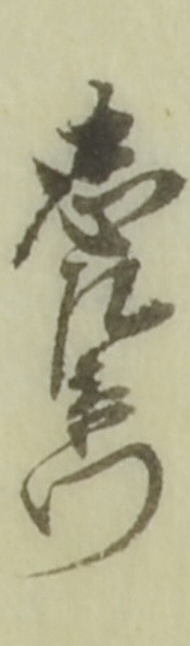忠左衛門
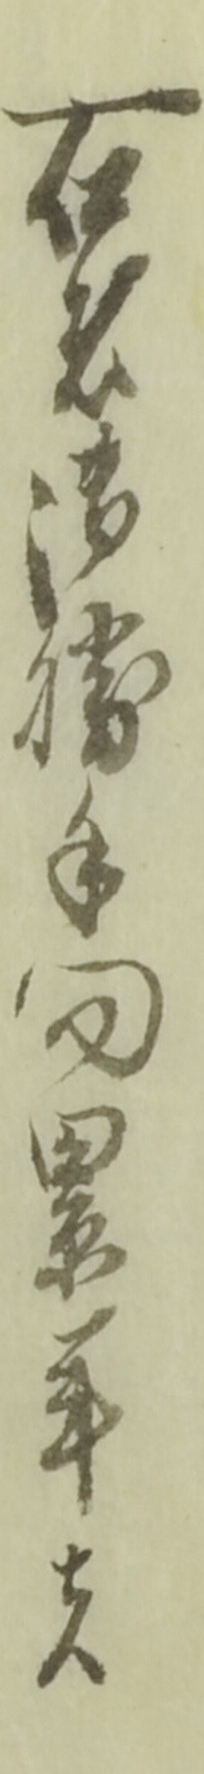右者御勝手向累年物
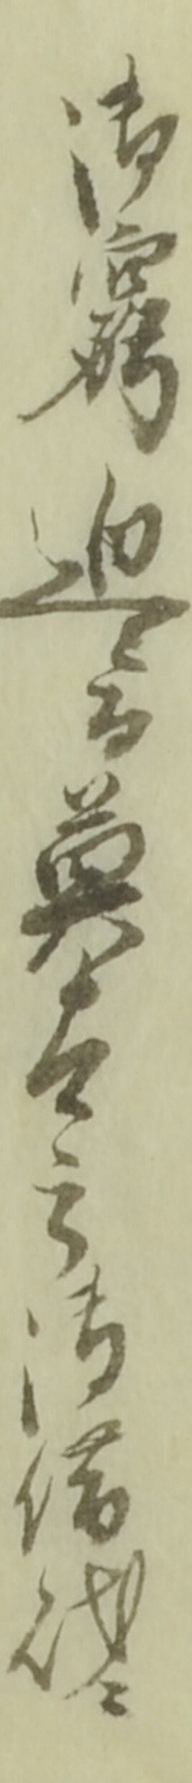御窮迫ニ而莫太之御借財ニ
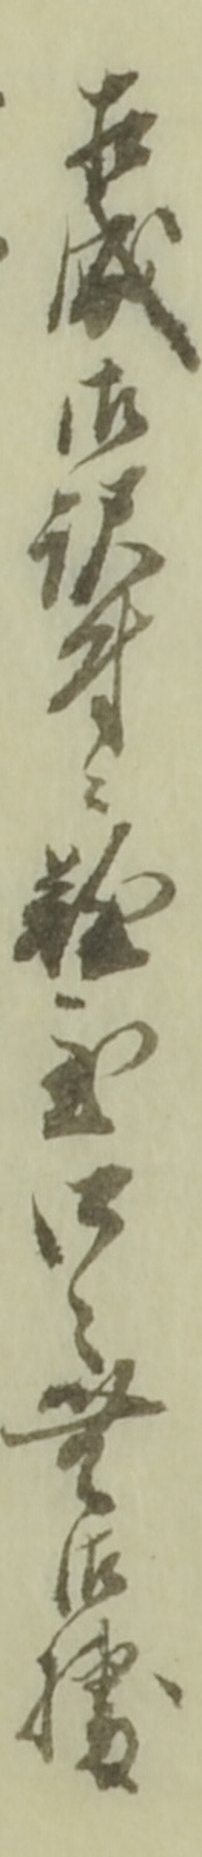相成御訳付ニ難置口々無御拠
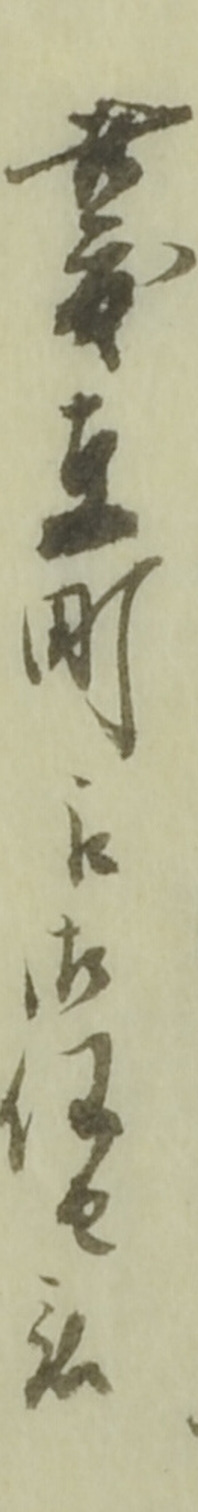此度在町江御任セ被
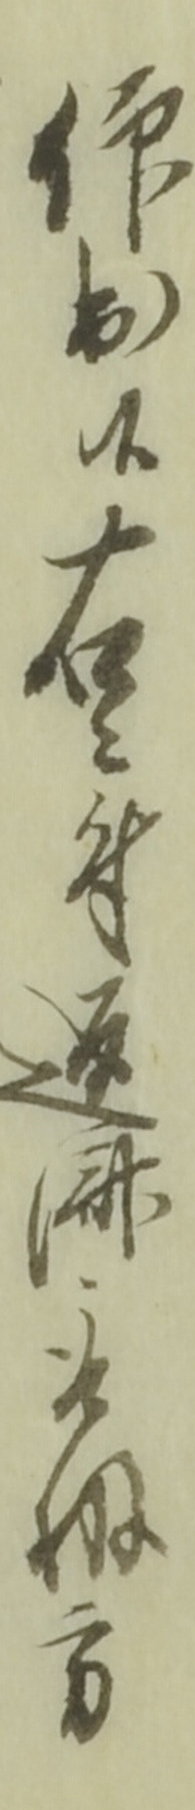仰出候右ニ付返済取扱方
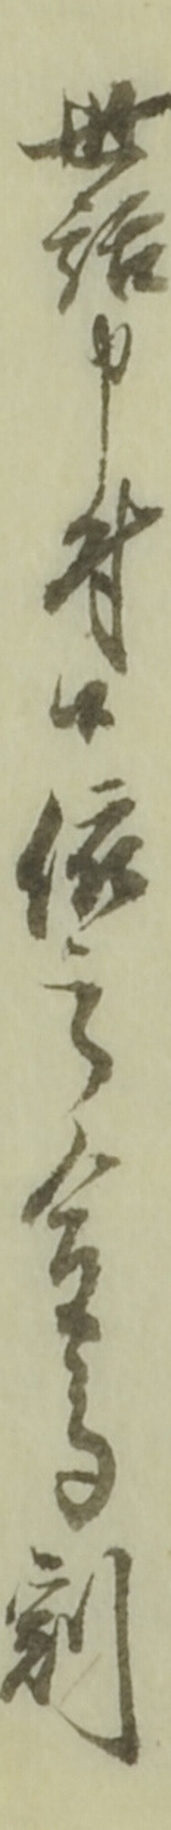世話申付候依之金子割
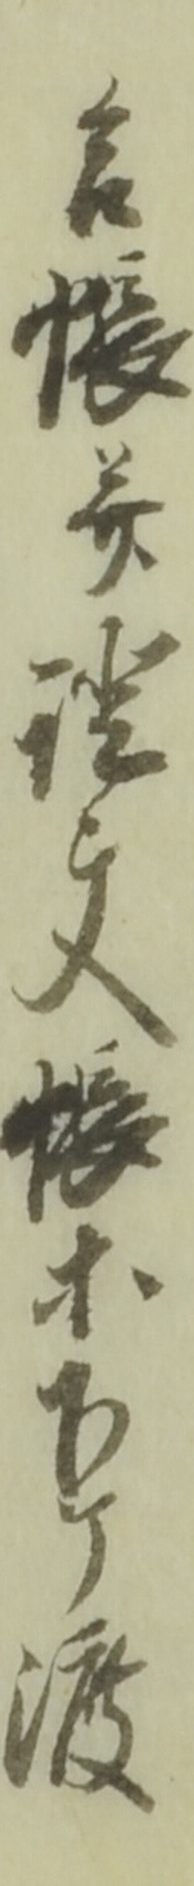合帳并証文帳等下ケ渡
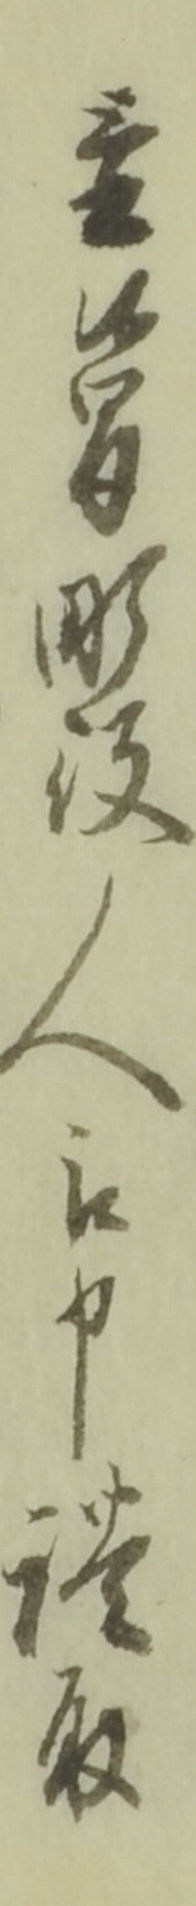置候間町役人江申談取
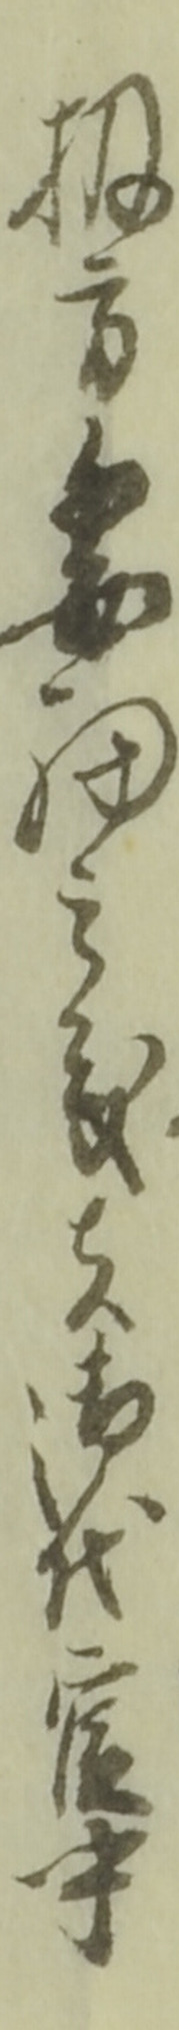扱方委細之義者御代官中
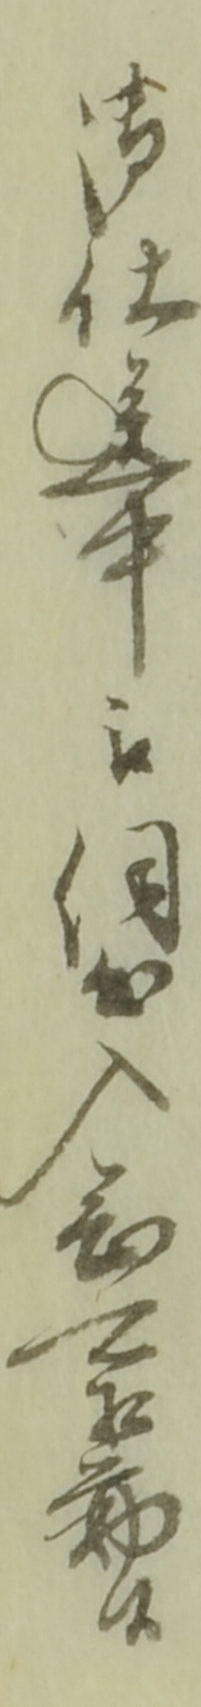御仕送中江伺出入念可相勤候
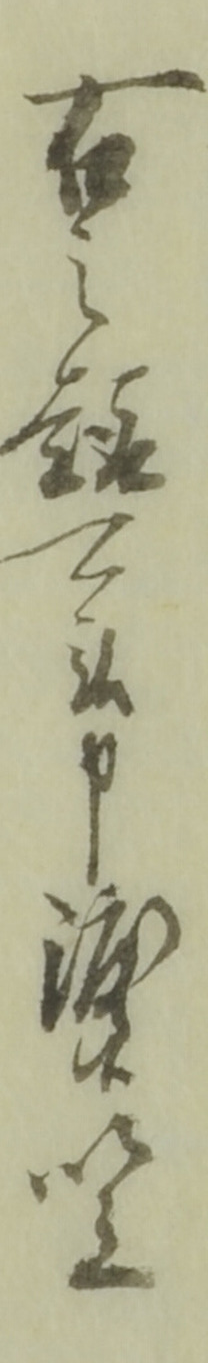右之趣可被申渡候以上
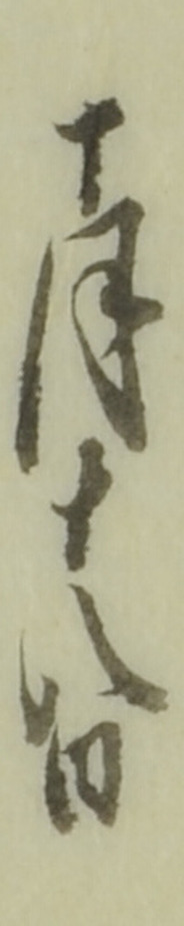十月十八日

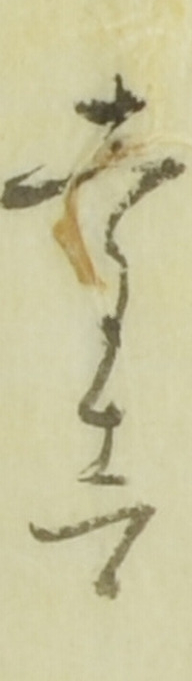十一月十二日
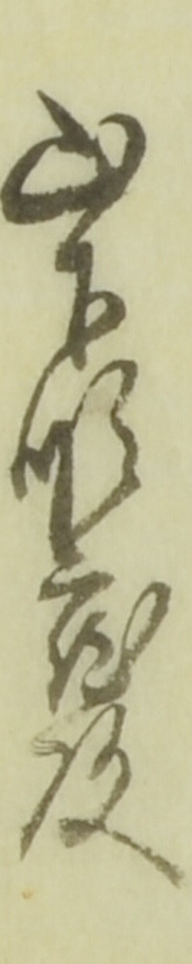山下順蔵殿
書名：御触書御書附控
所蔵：伊那市立高遠町図書館・合同会社AMANE
